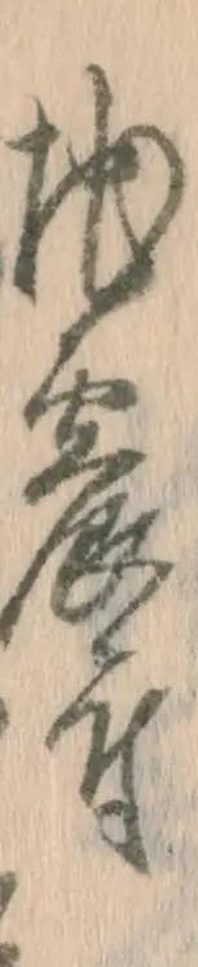地震ニ付
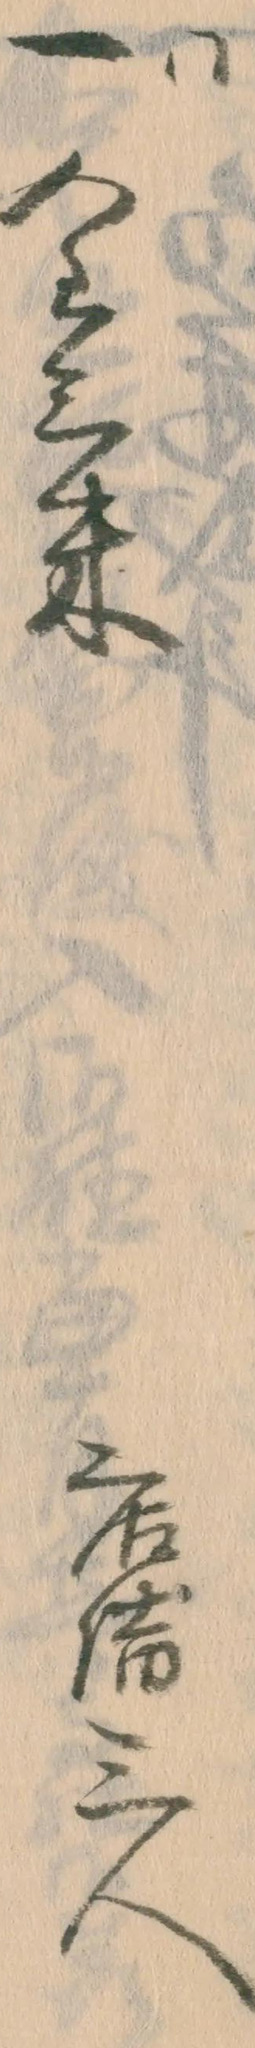一金三朱店借三人
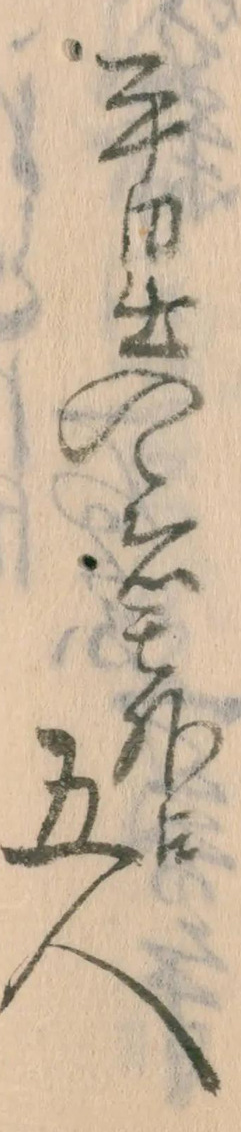同平日出入之者其外え
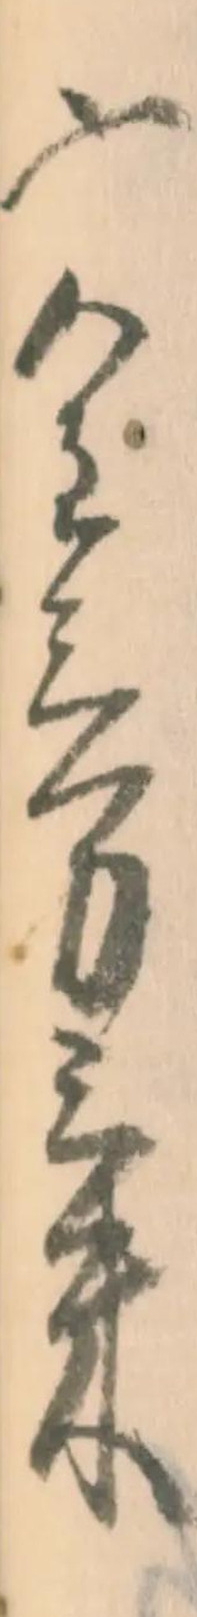〆金三分三朱
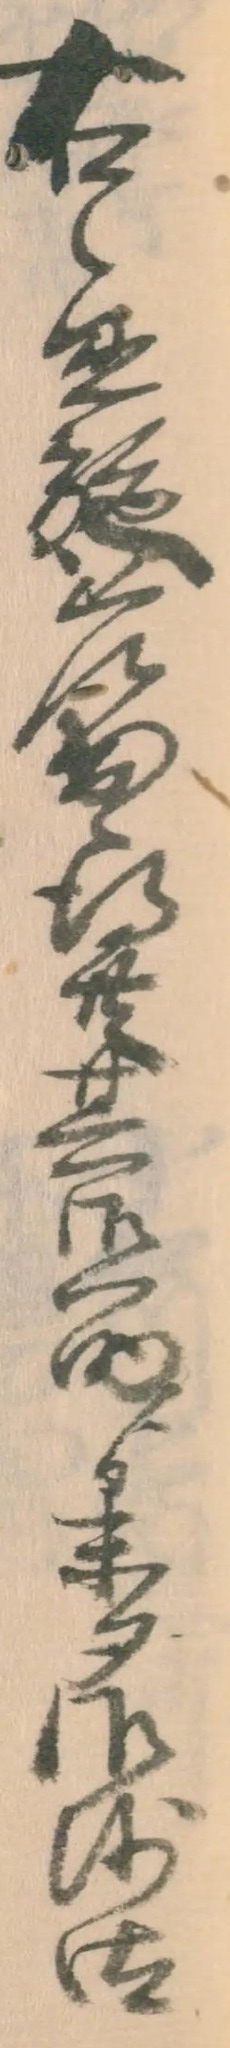右之通施差出候得共其御筋ゟ未タ御沙汰
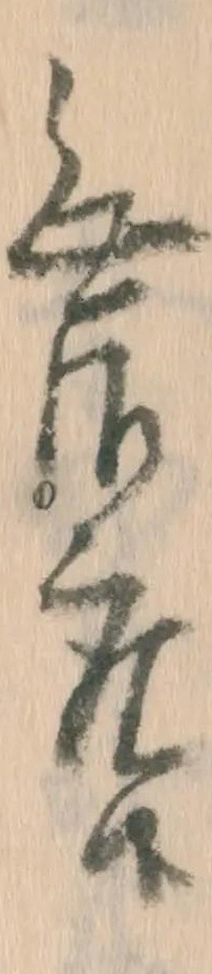無御座候
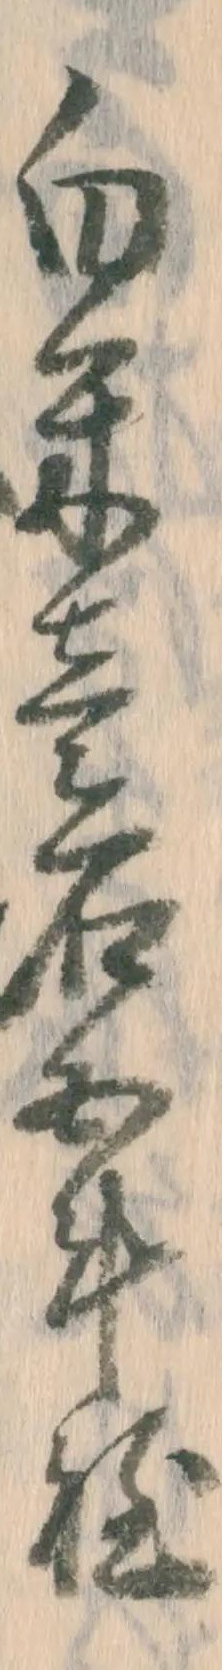一白米壱石五斗程
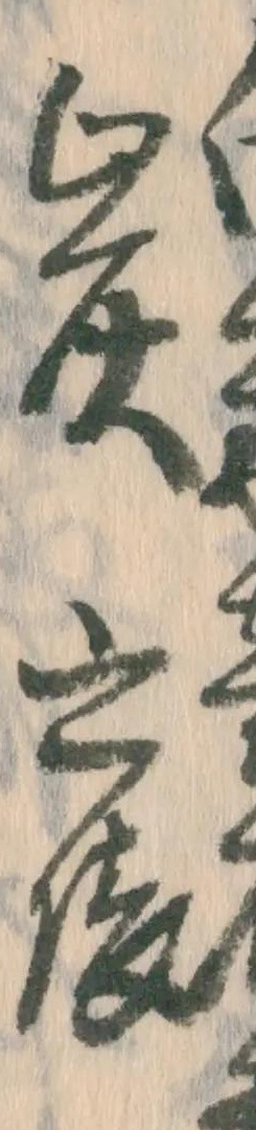炭六俵
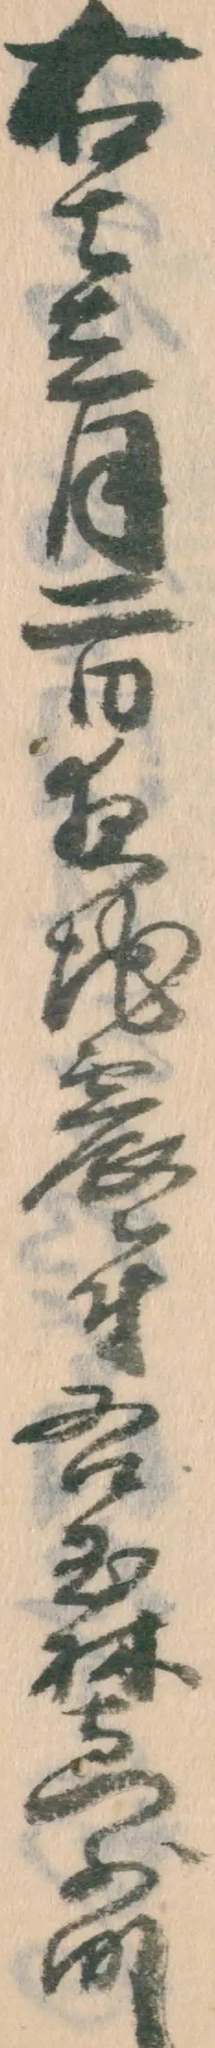右は壱月二日夜地震ニ付右玉林寺門前町

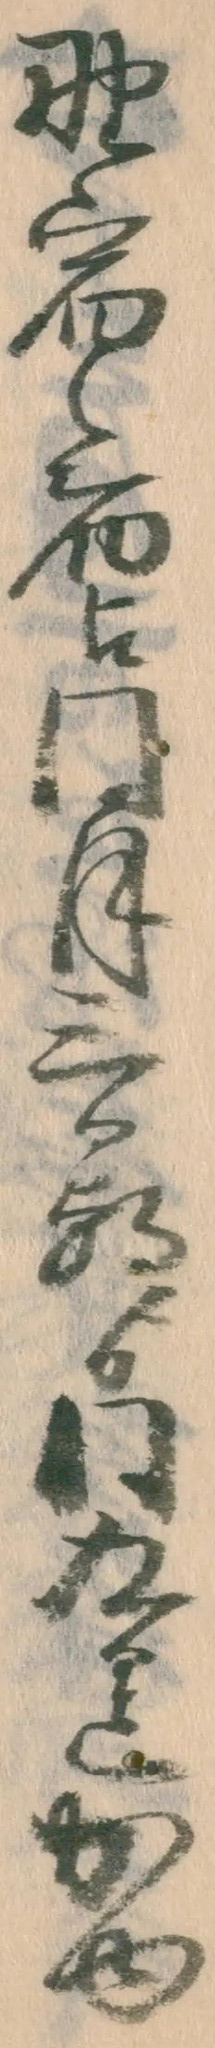野宿之者え同月三日朝より同九日迄かゆ
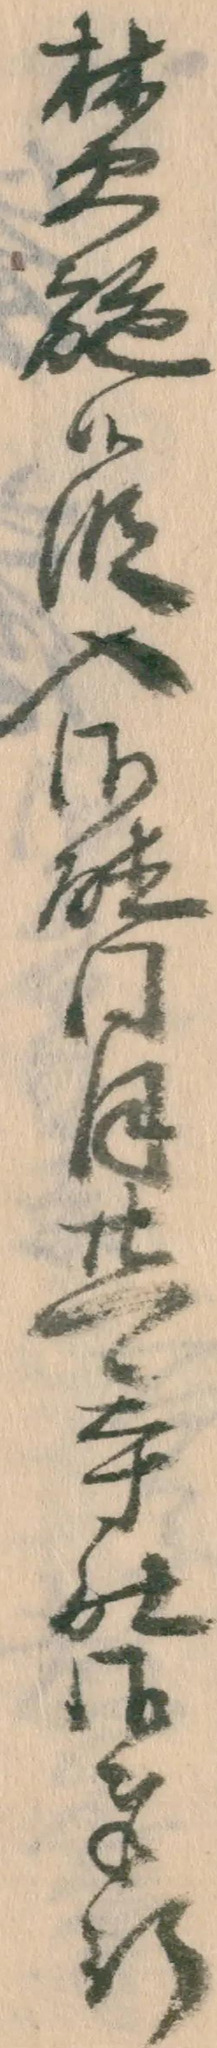焚施候段入御聴同月廿一日寺社御奉行
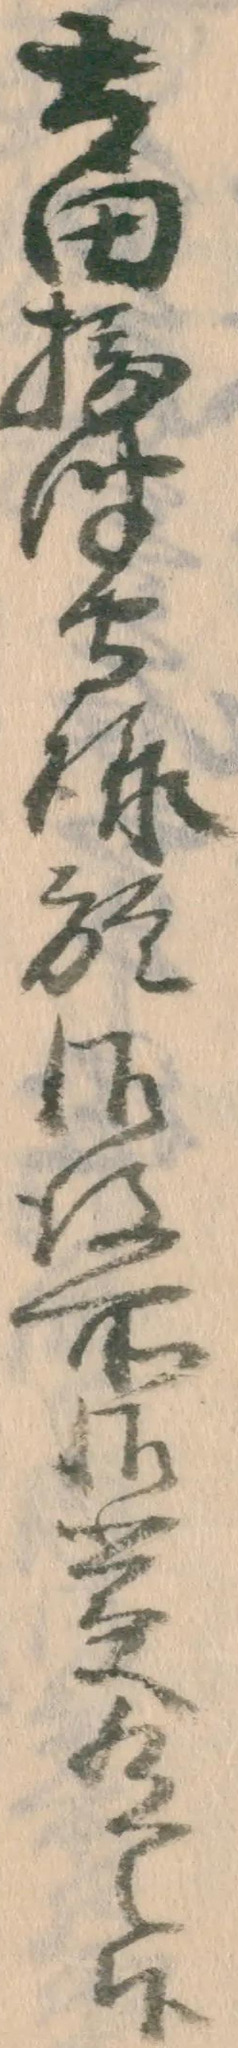太田摂津守様於御役所御賞有之候
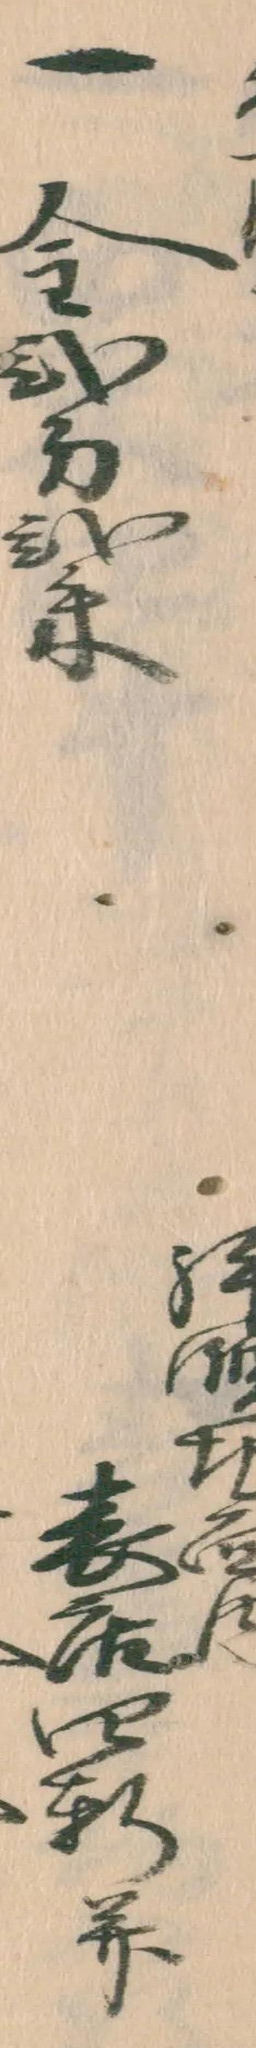一金弐分弐朱表店四軒并
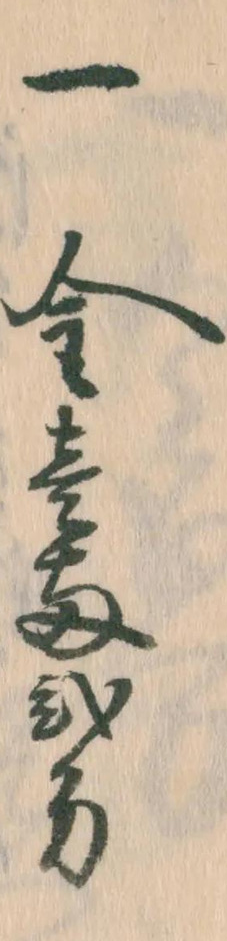一金壱両弐分同
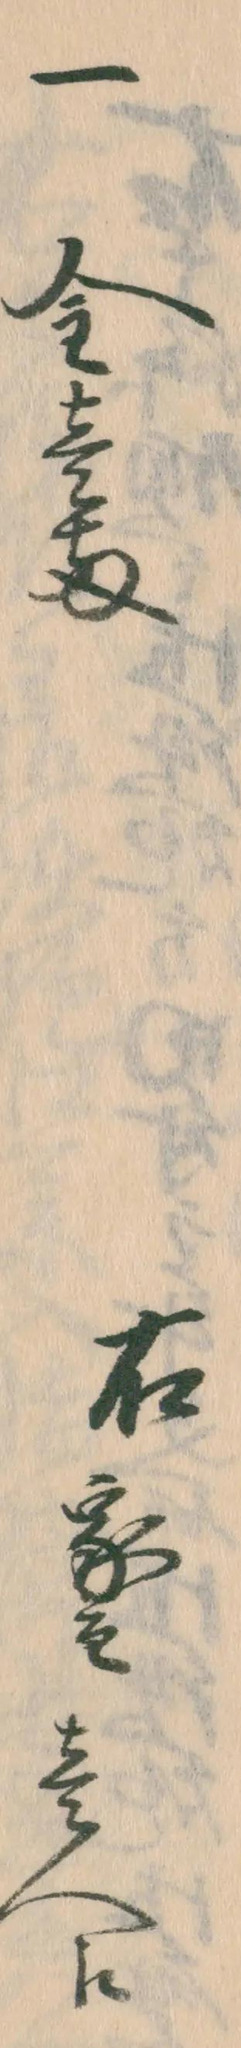一金壱両右家主壱人え

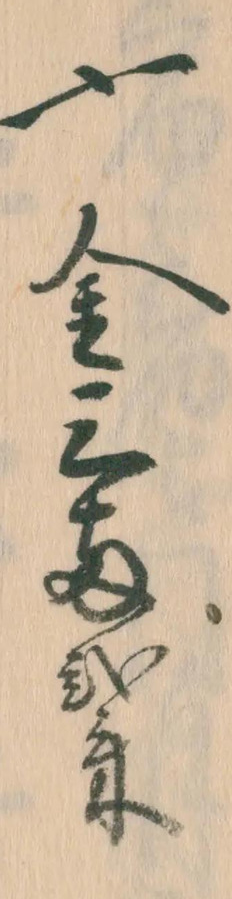〆金三両弐朱
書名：武家方并寺院等ニテ施差出候一件
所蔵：国立国会図書館 National Diet Library, JAPAN
